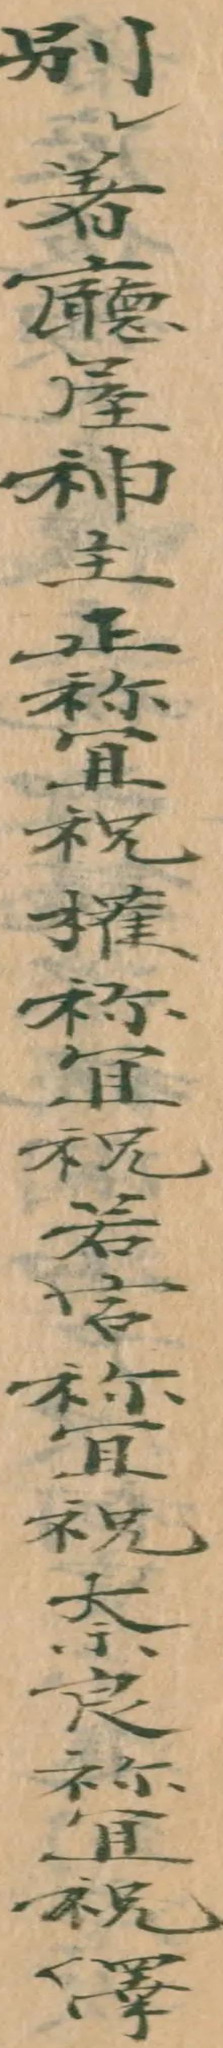別着庁屋神主正禰宜祝権禰宜祝若宮禰宜祝奈良禰宜祝沢
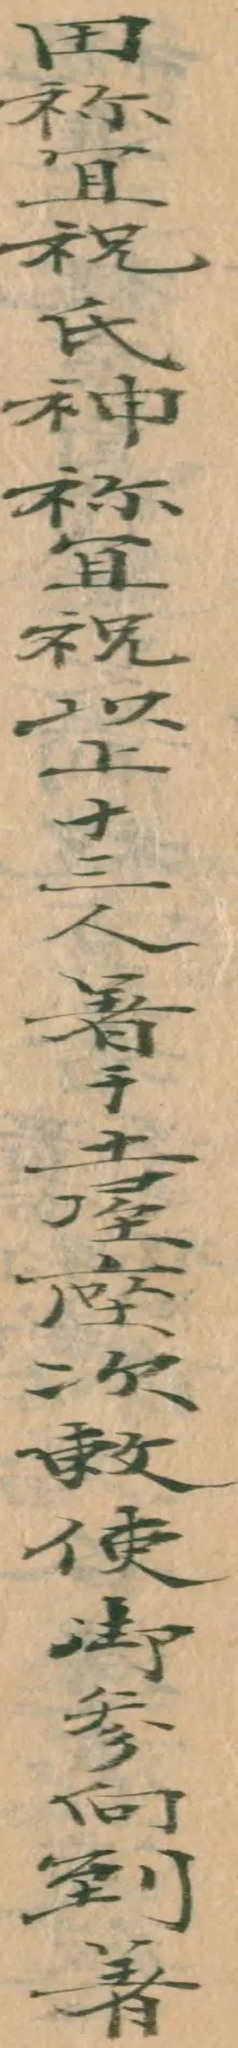田禰宜祝氏神禰宜祝以上十三人着于土居座次勅使御参向到着
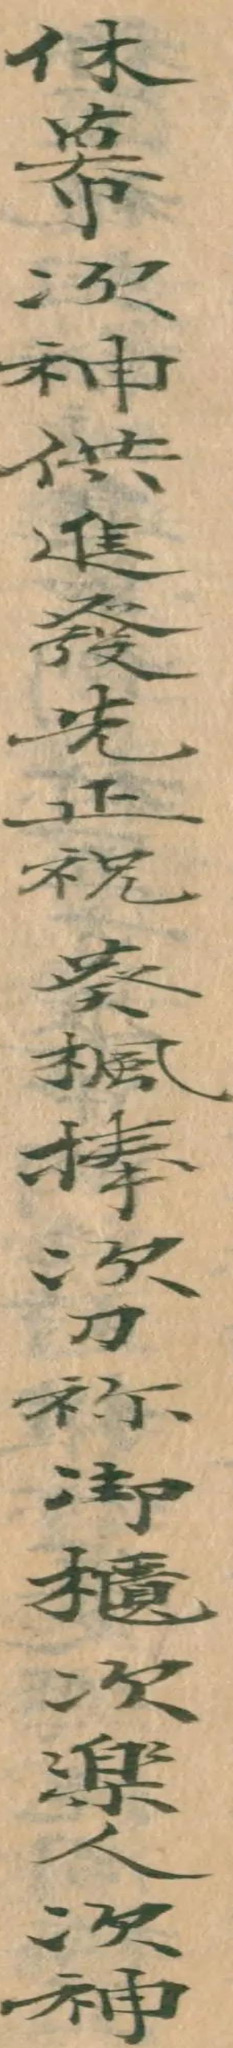休幕次神供進発先正祝葵楓捧次刀禰御櫃次楽人次神
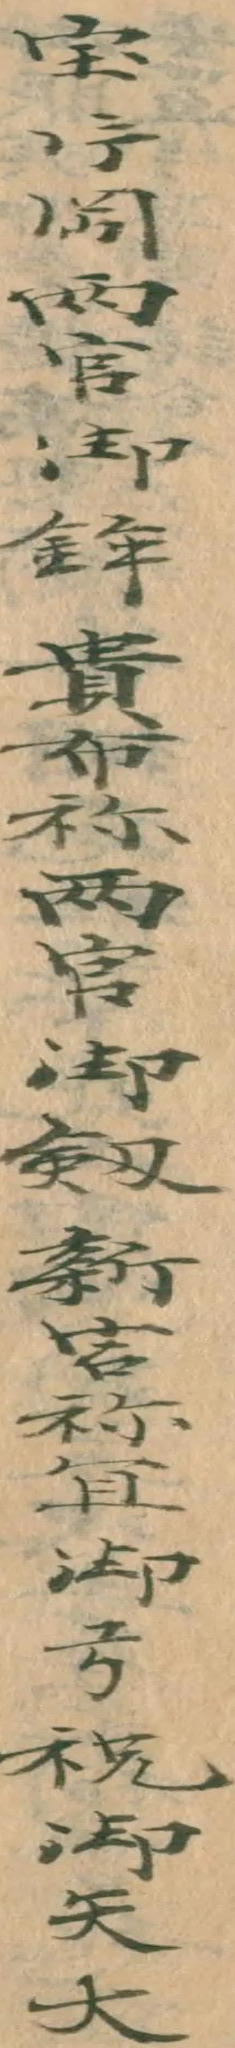宝片岡両官御鉾貴布禰両官御剱新宮禰宜御弓祝御矢大
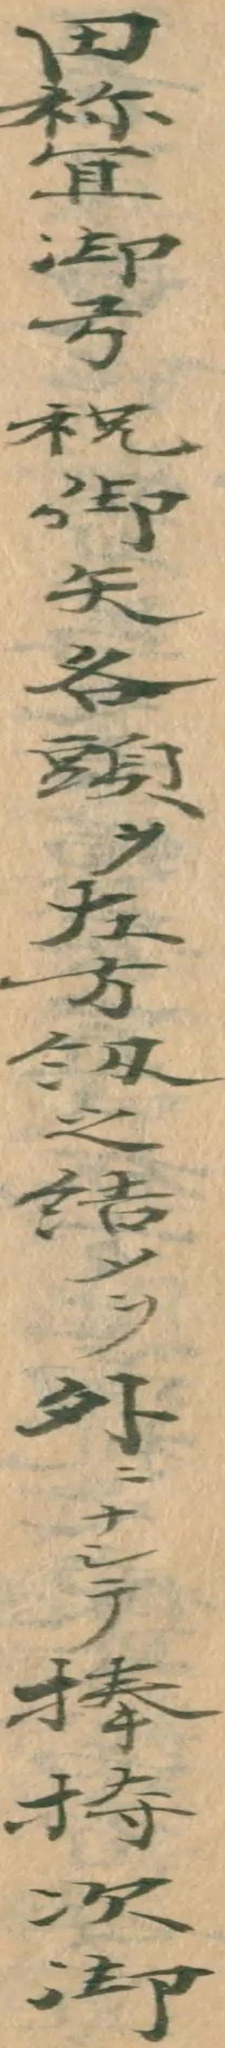田禰宜御弓祝御矢各頭ヲ左方紉之結メヲ外ニナシテ棒持次御
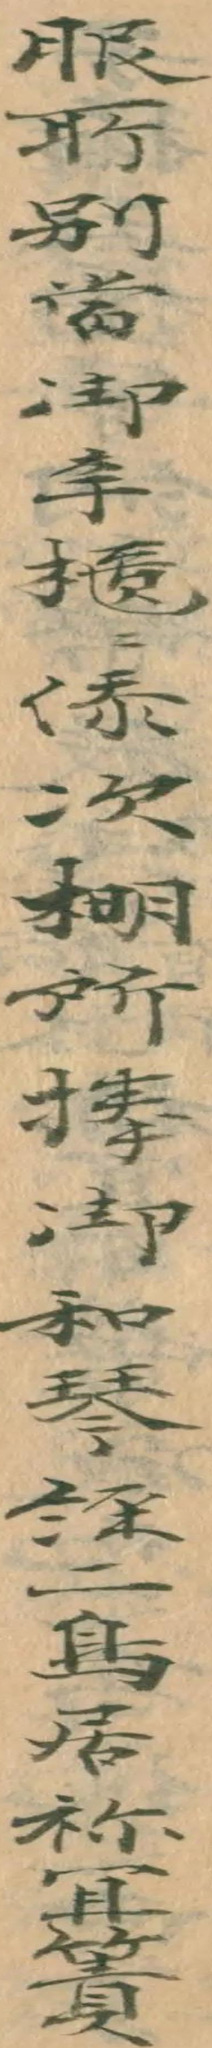服所別当御手櫃ニ添次棚所捧御和琴経二鳥居禰宜簀

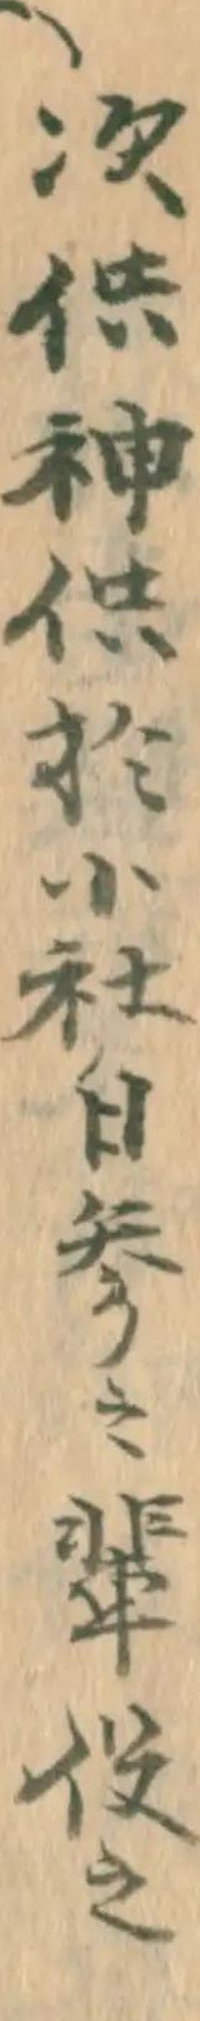次供神供於小社日参之輩役之
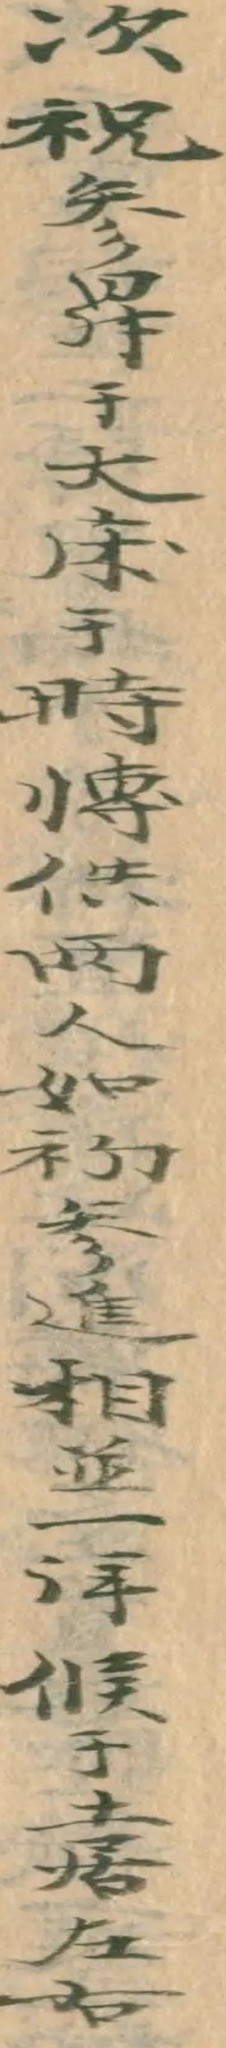次祝参昇于大床于時転供両人如初参進相並一拝候于土居左右
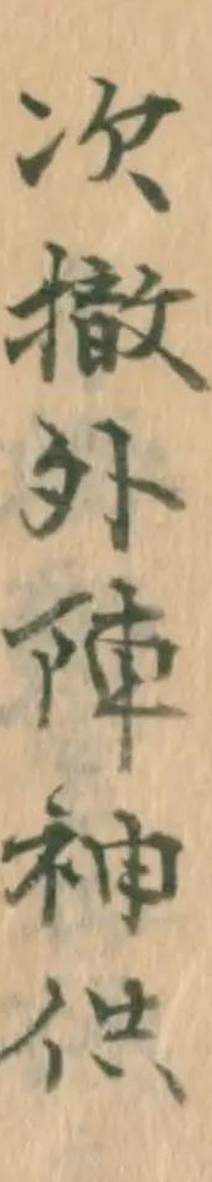次撤外陣神供
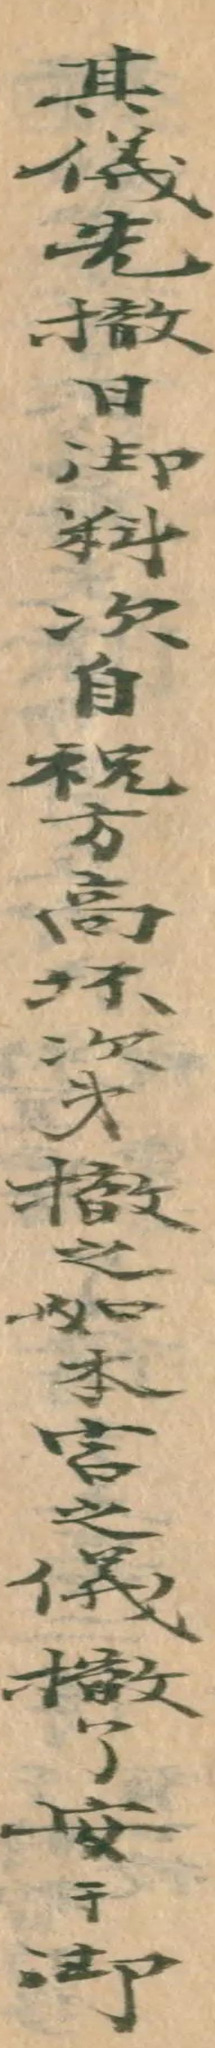其儀先撤日御料次自祝方高抔次第撤之如本宮之儀撤了安于御
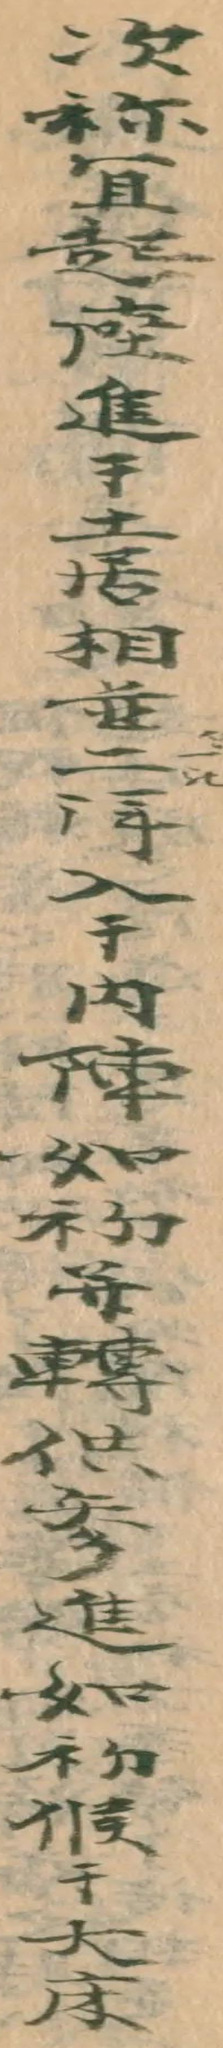次禰宜起座進于土居相並二拝入于内陣如初并転供参進如初候于大床
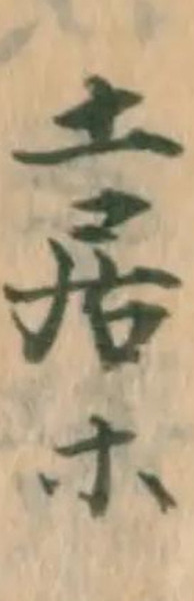土居等
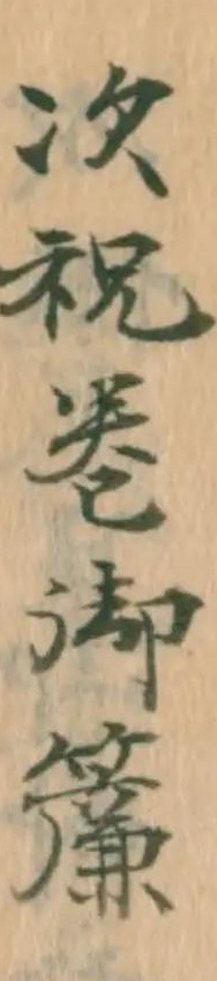次祝巻御簾
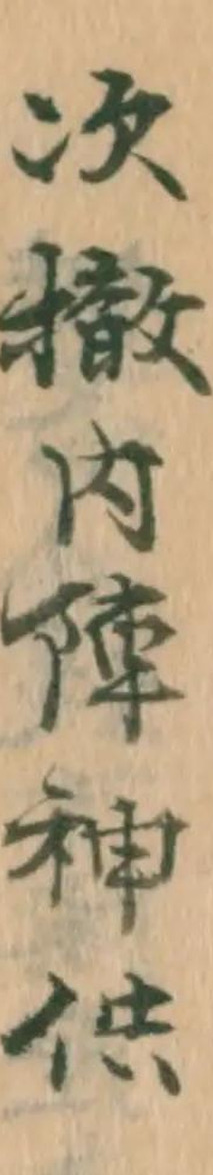次撤内陣神供
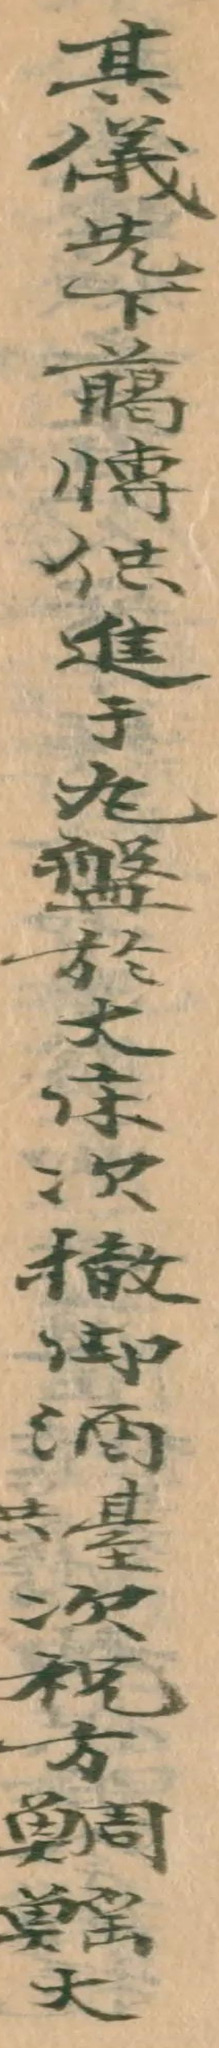其儀先下臈転供進于丸盤於大床次撤御酒台共次祝方鯛鰩大
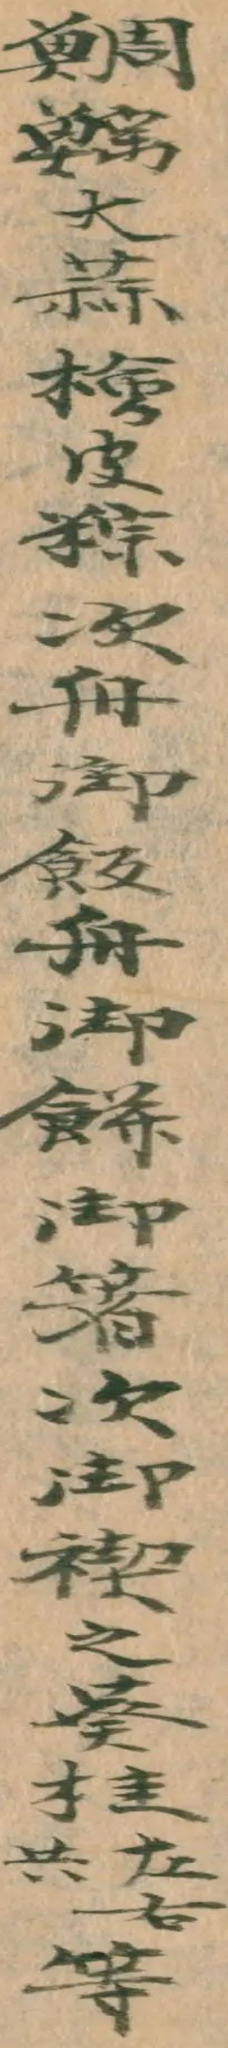鯛鰩大蒜檜皮粽次舟御飯舟御餅御箸次御禊之葵桂左右共等
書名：賀茂社記録. 第5冊
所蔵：国立国会図書館 National Diet Library, JAPAN
